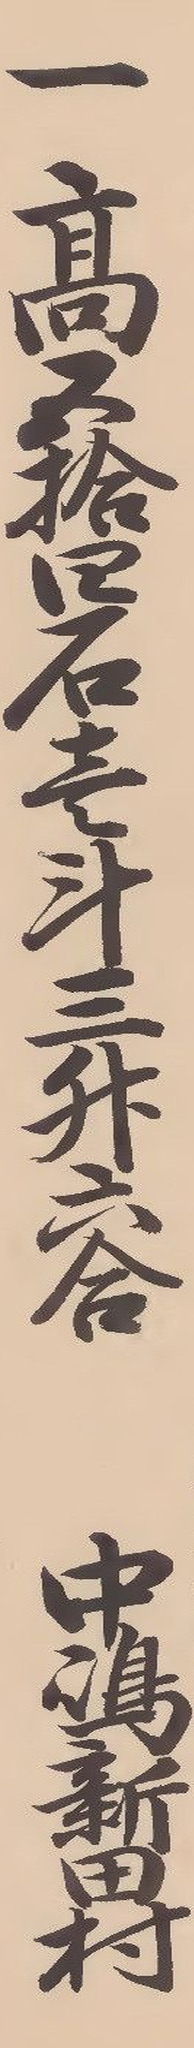一高五拾四石壱斗三升六合中島新田村
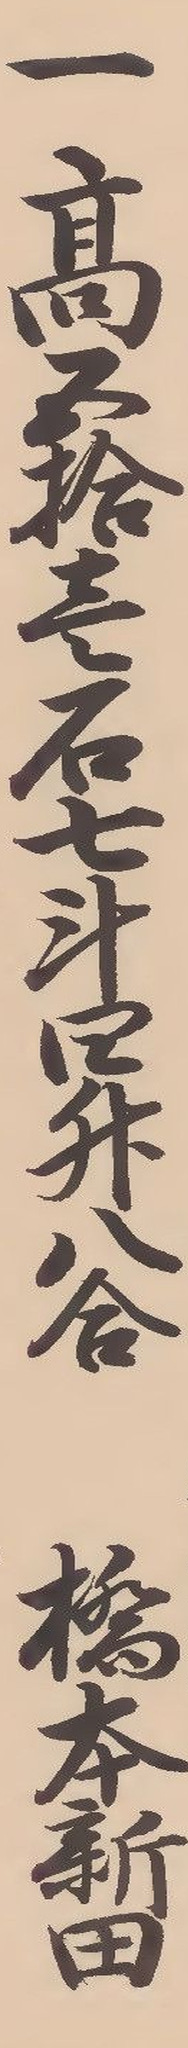一高五拾壱石七斗四升八合橋本新田

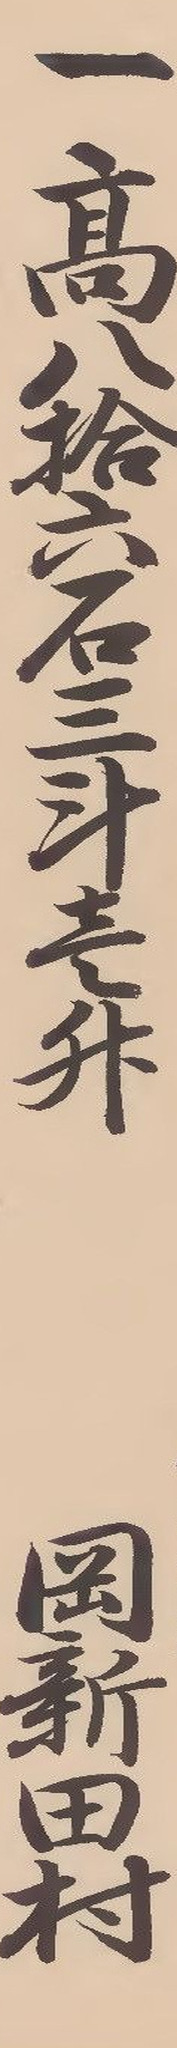一高八拾六石三斗壱升岡新田村
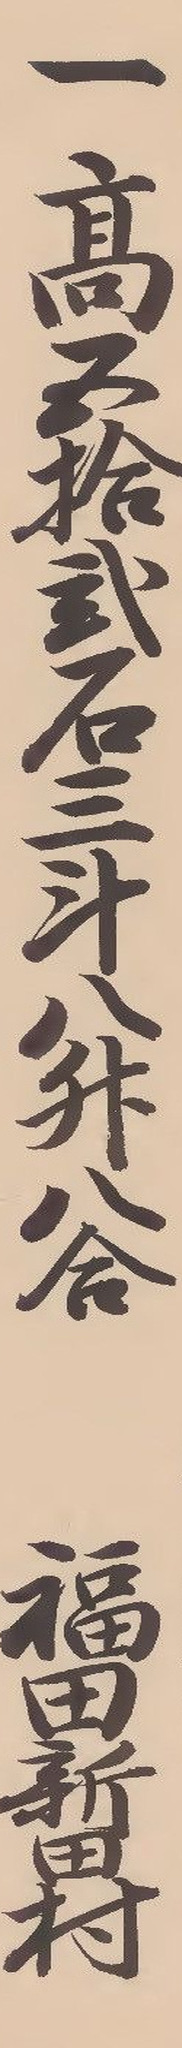一高五拾弐石三斗八升八合福田新田村
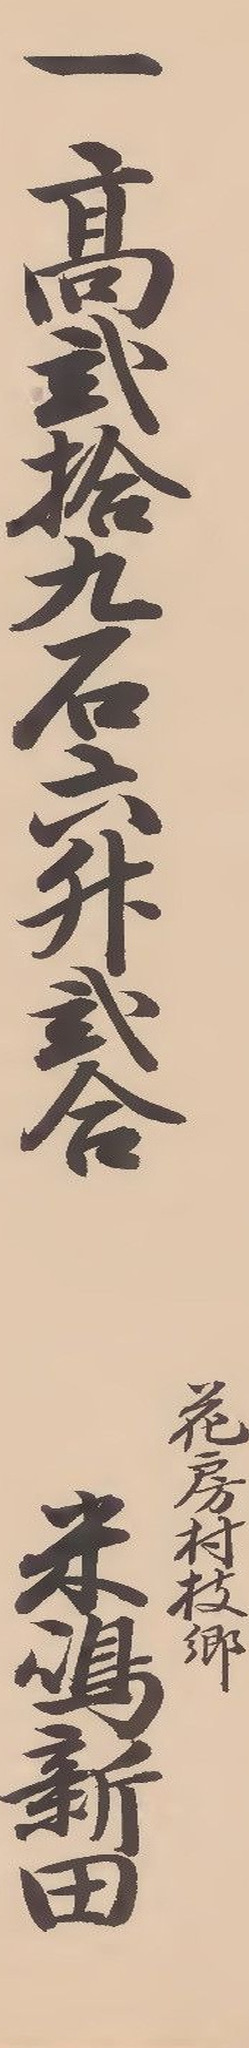一高弐拾九石六升弐合米島新田
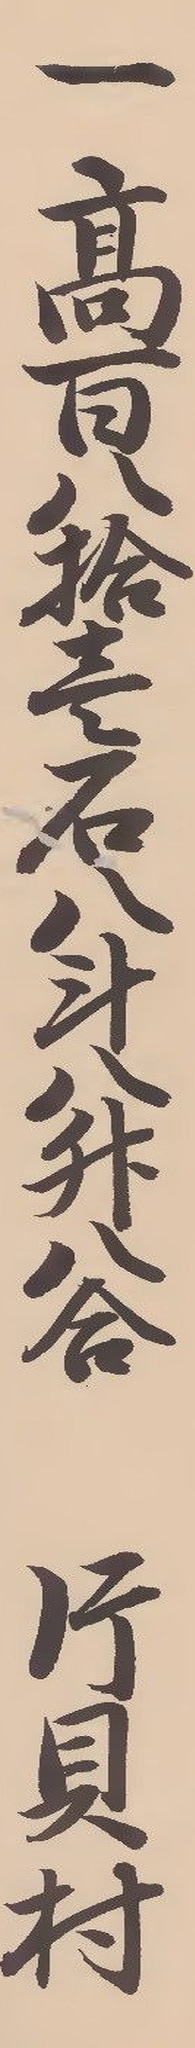一高百八拾壱石八斗八升八合片貝村
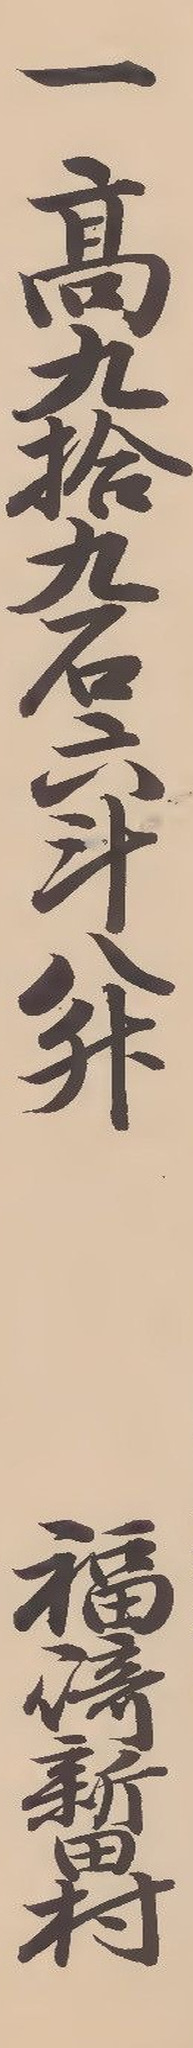一高九拾九石六斗八升福崎新田村
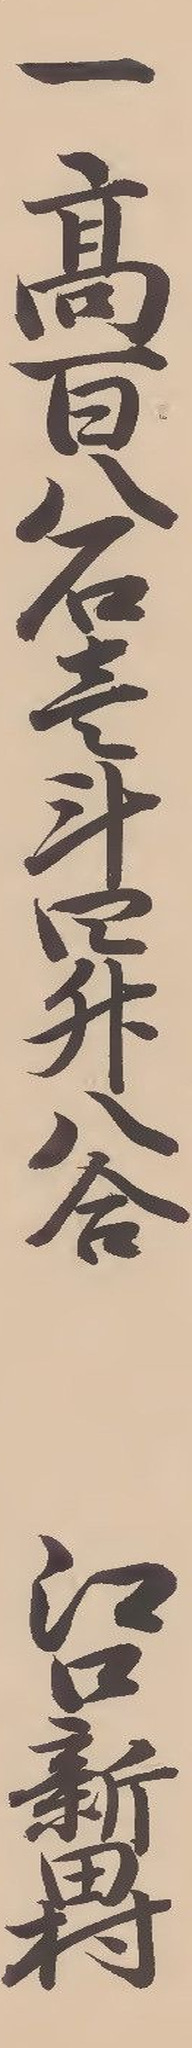一高百八石壱斗四升八合江口新田村
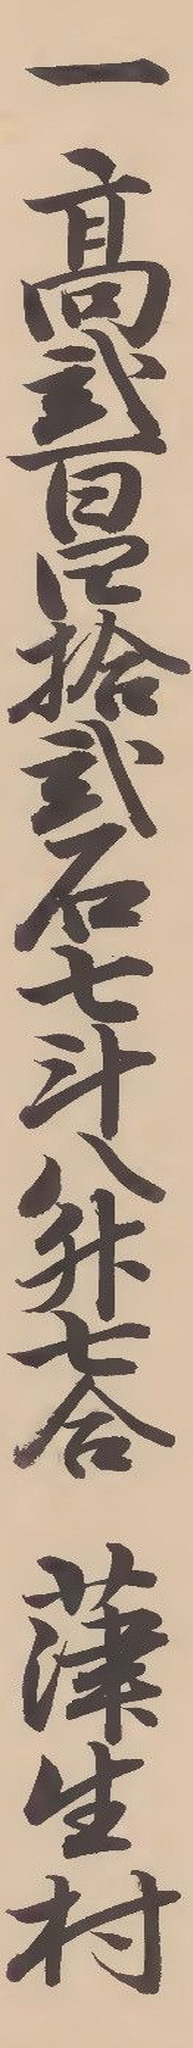一高弐百四拾弐石七斗八升七合葎生村

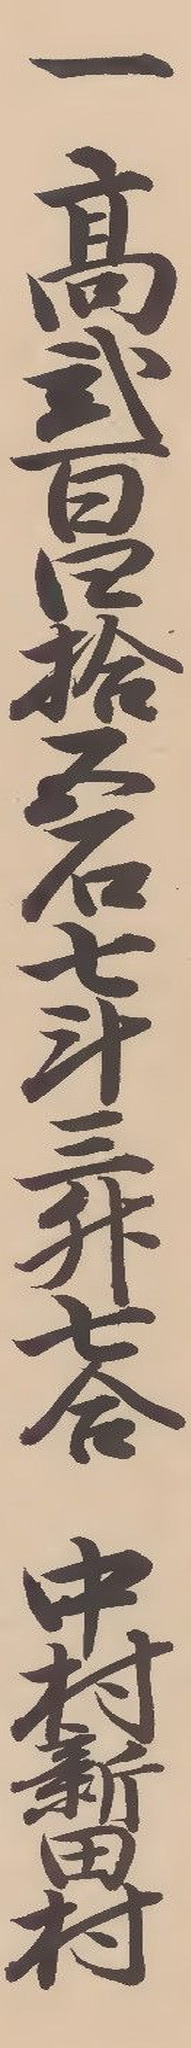一高弐百四拾五石七斗三升七合中村新田村
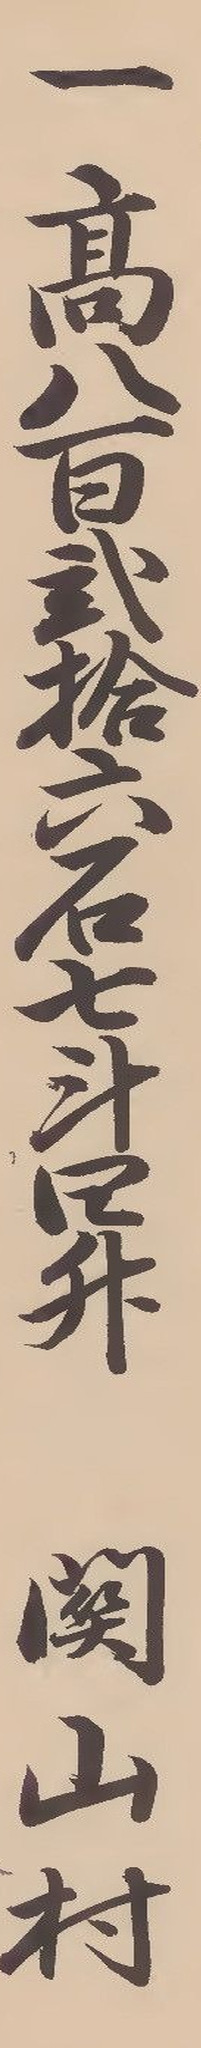一高八百弐拾六石七斗四升関山村
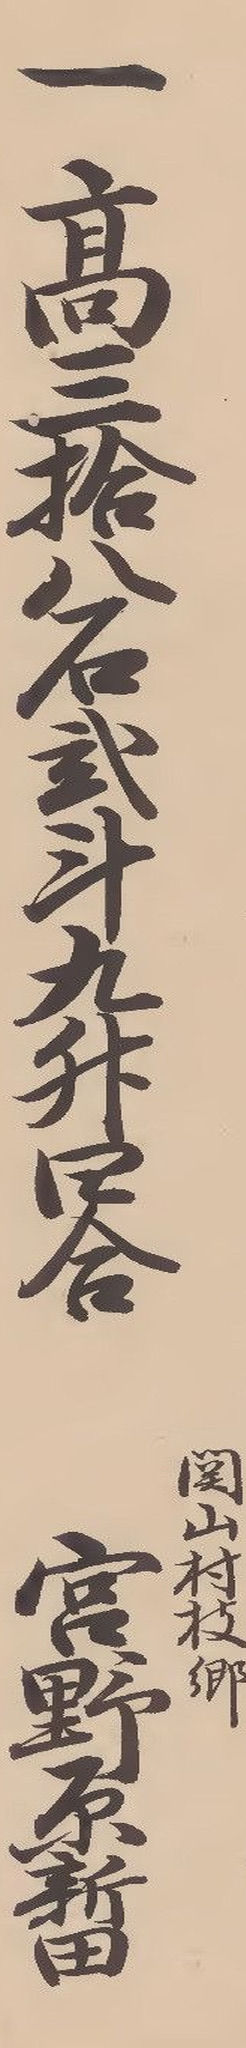一高三拾八石弐斗九升四合宮野原新田
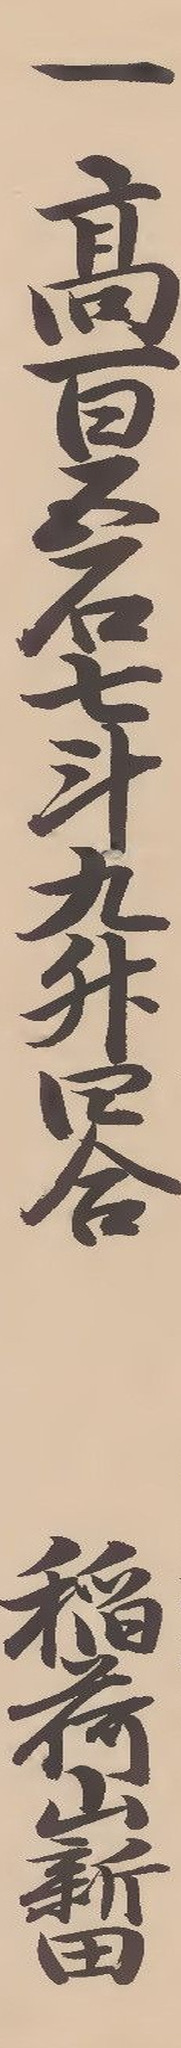一高百五石七斗九升四合稲荷山新田
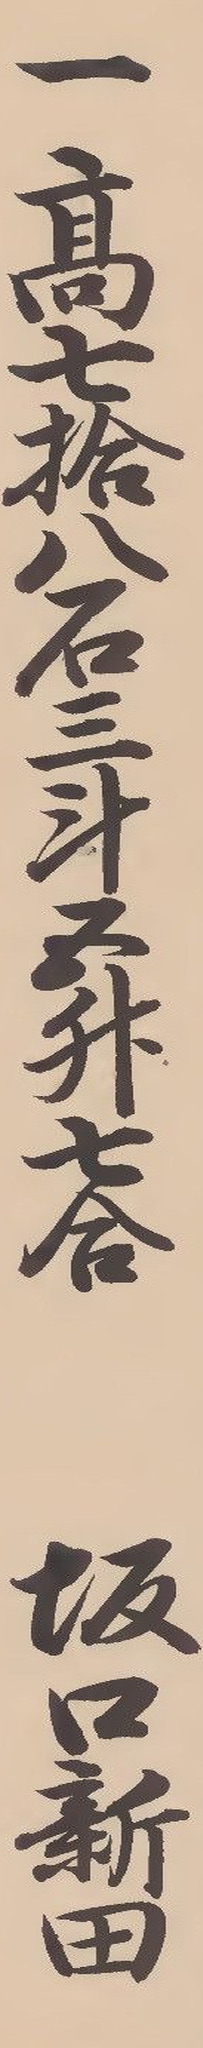一高七拾八石三斗五升七合坂口新田
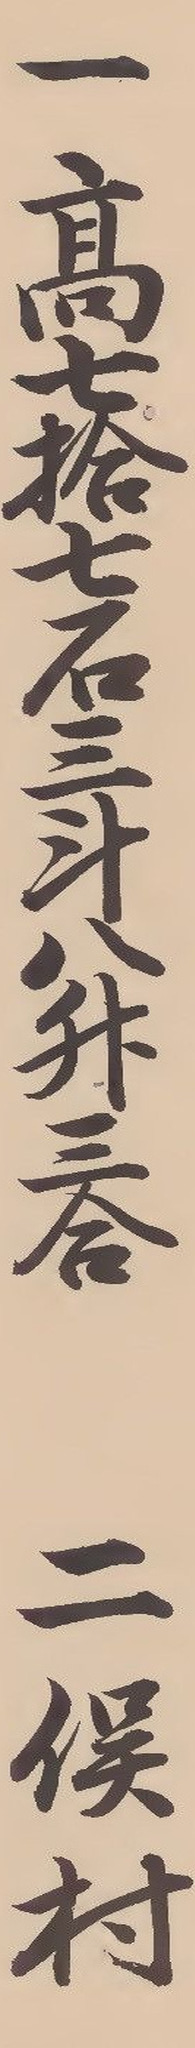一高七拾七石三斗八升三合二俣村
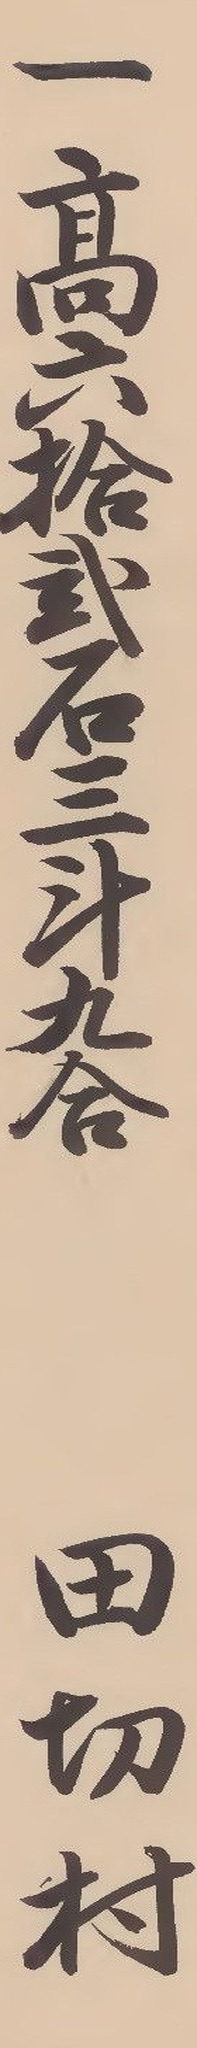一高六拾弐石三斗九合田切村
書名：越後国郷帳　上
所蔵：国立公文書館 National Archives of Japan
